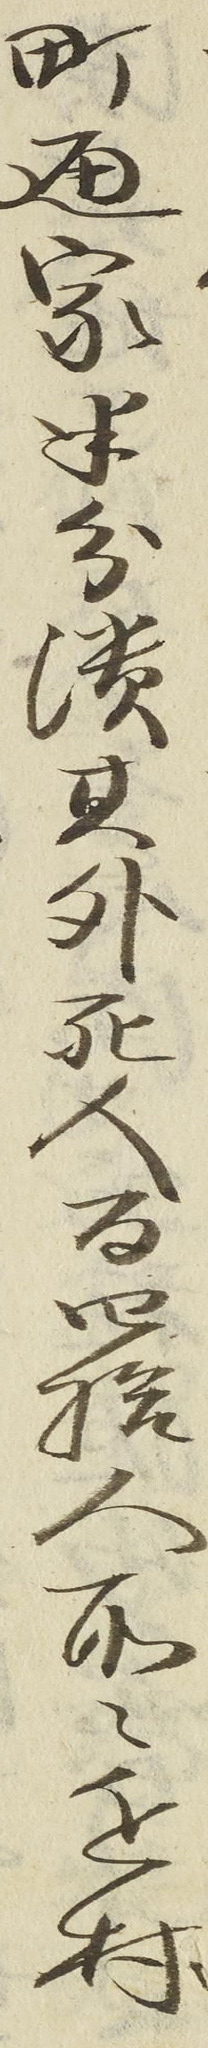町通家半分潰其外死人百四拾人所々近村
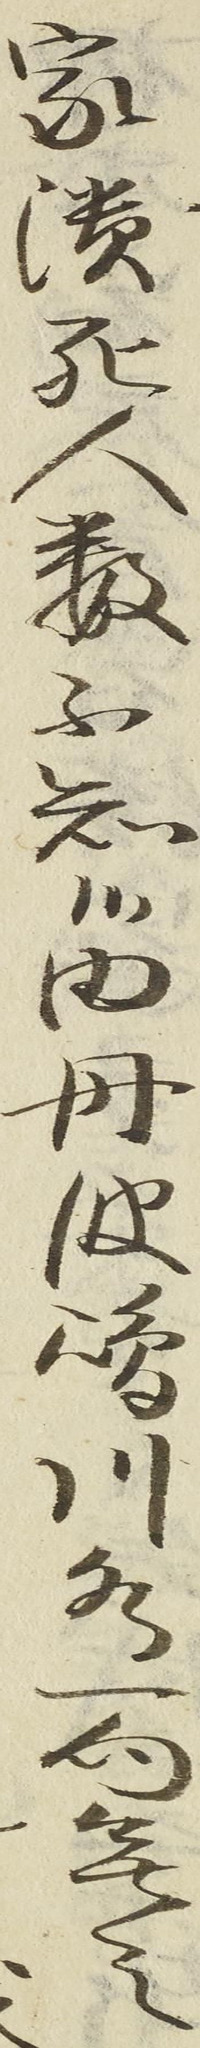家潰死人数不知候由丹波嶋川水一向無之
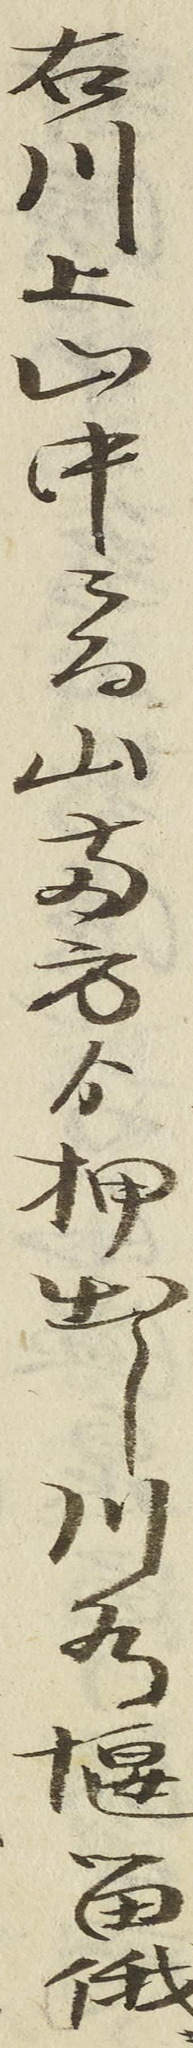右川上山中二而山高方ゟ押出し川水堰留俄
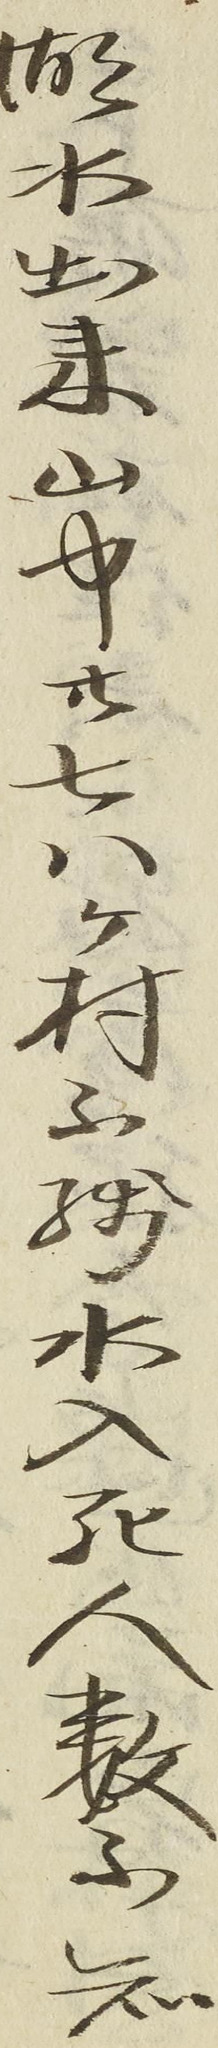湖水出来山中廿七八ヶ村不残水入死人数不知
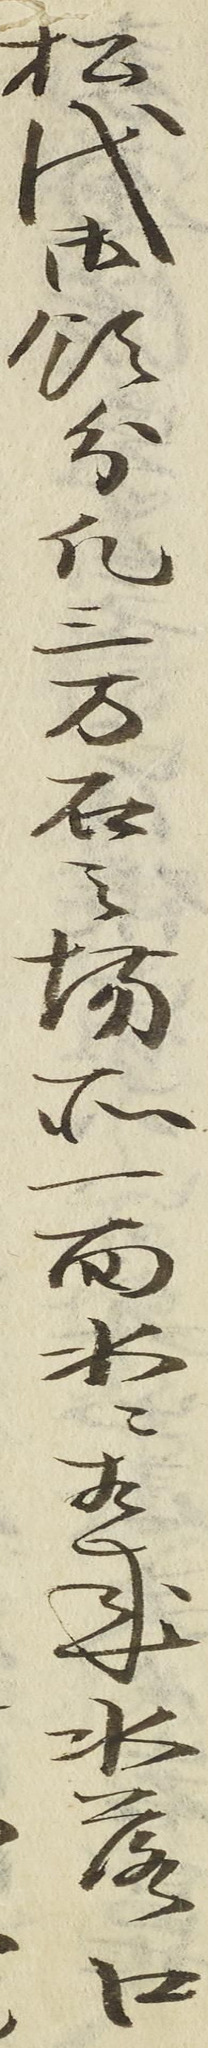松代御領分凡三万石之場所一面水二相成水落口
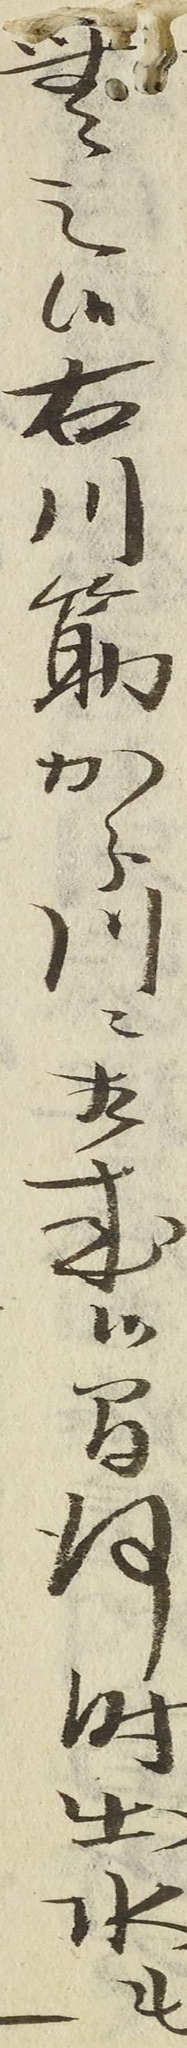無之候右川筋から川二相成候間何時出水も
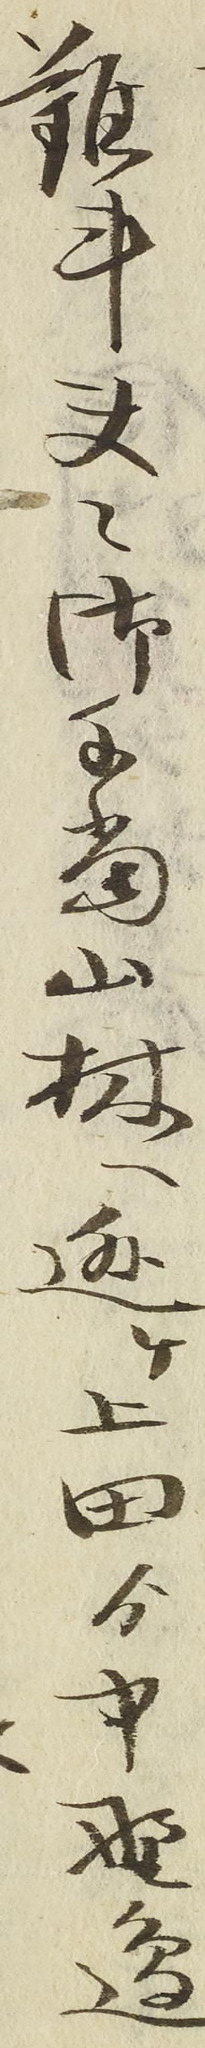難斗夫々御手当山林へ逃ヶ上田ゟ中野辺
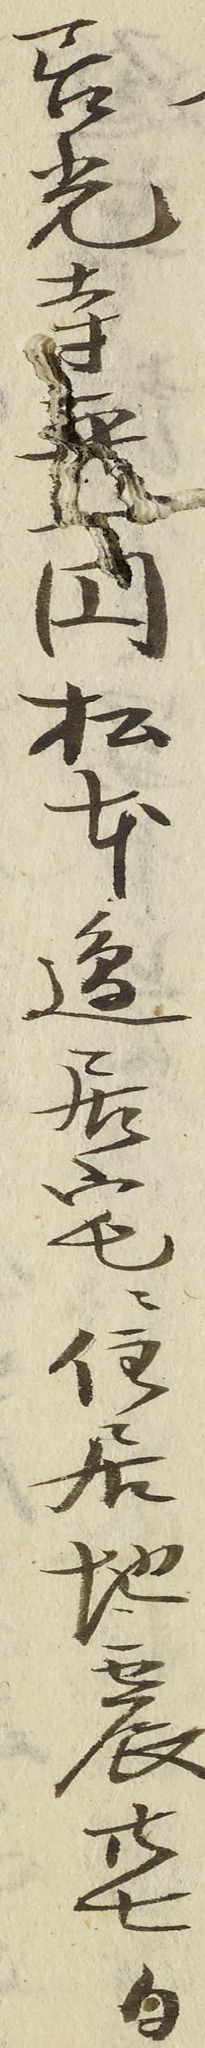善光寺平一円松本辺居宅二住居地震廿七日
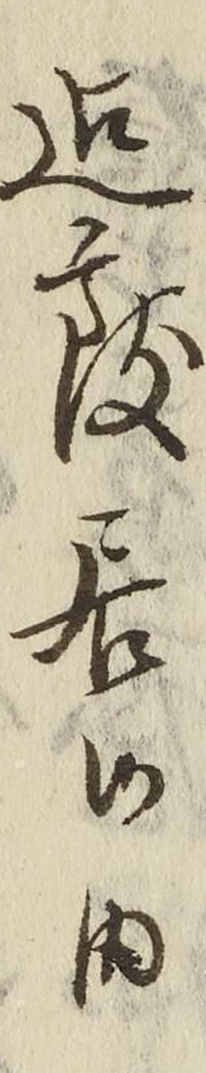迄致居候由
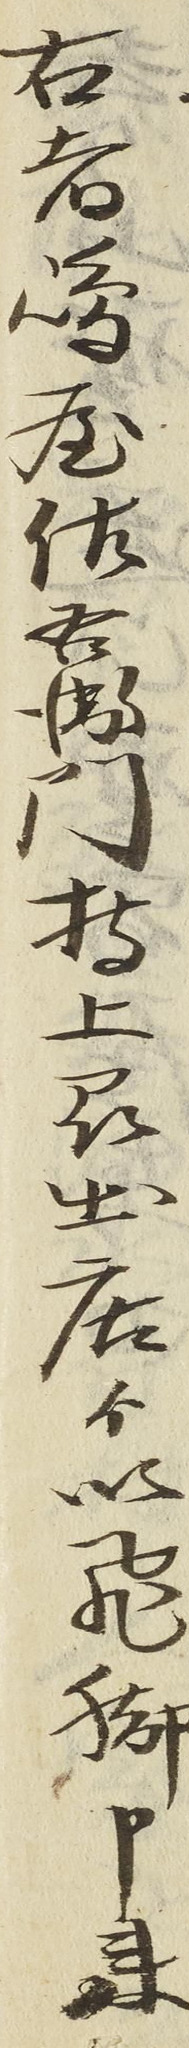右は嶋屋佐五衛門指上即出店ゟ以御飛脚申来
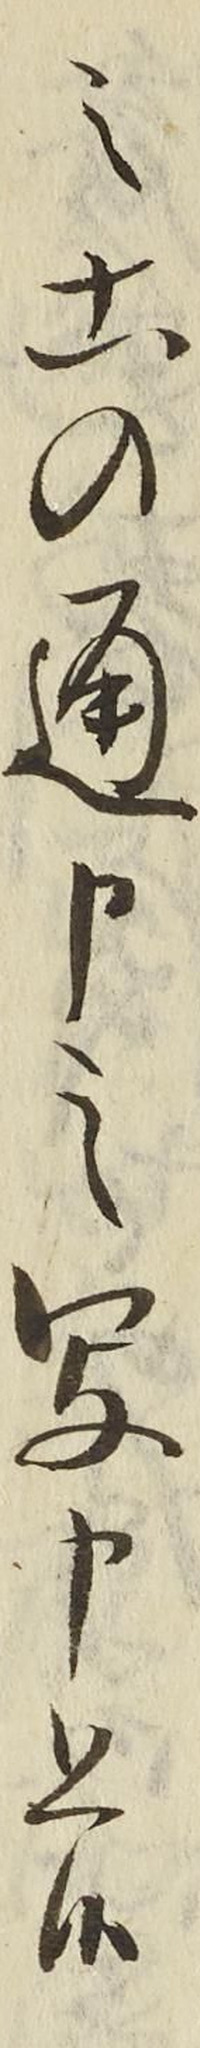之この通申之写申上候
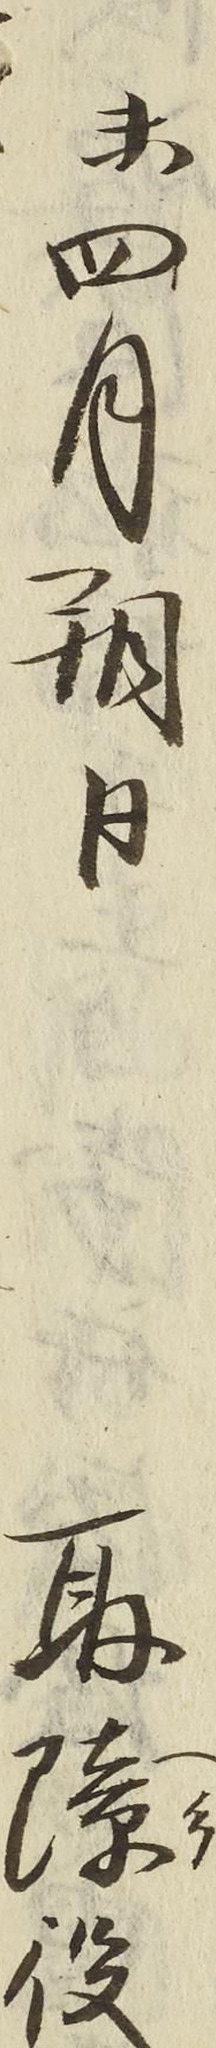未四月朔日取締役
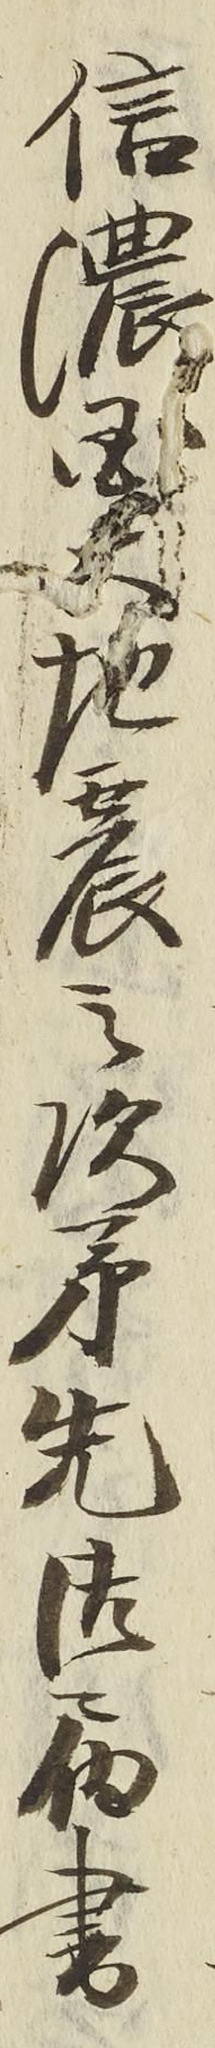信濃国地震之次第先御届書
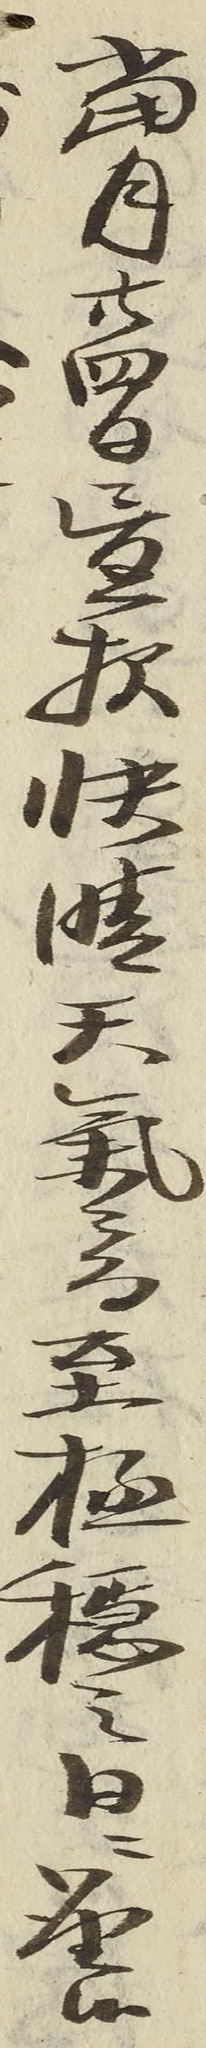当月廿四日昼夜快晴天気二而至極穏之日二御座候
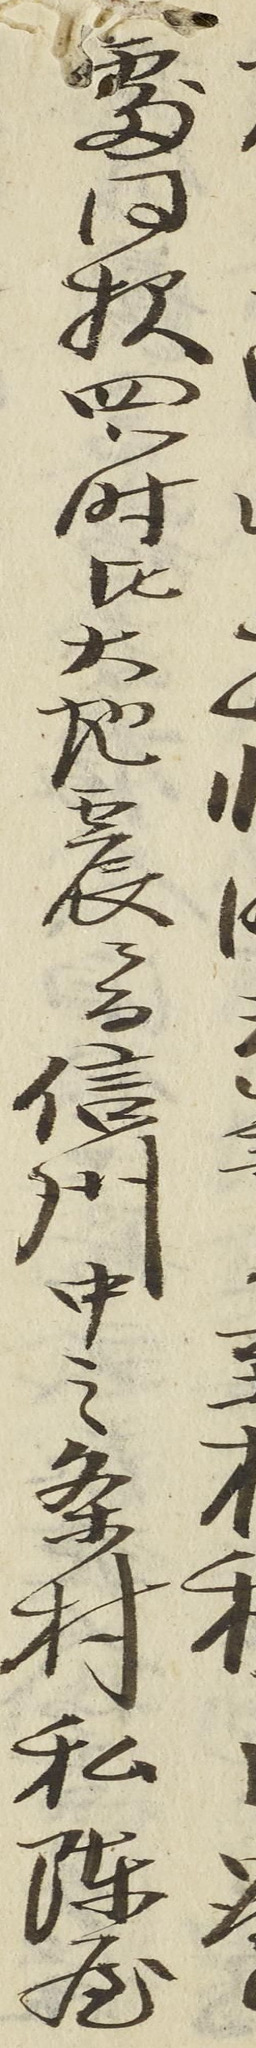処同夜四ッ時比大地震二而信州中之条村私陣屋
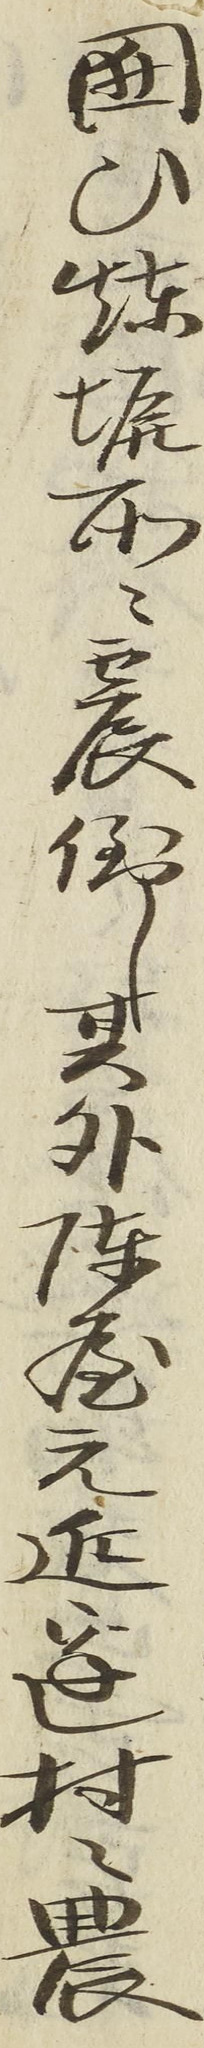囲ひ練塀所々震倒し其外陣屋元近辺村々農
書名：信濃國大地震記　乾
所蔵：東京大学地震研究所図書室 Earthquake Research Institute Library, The University of Tokyo, JAPAN
